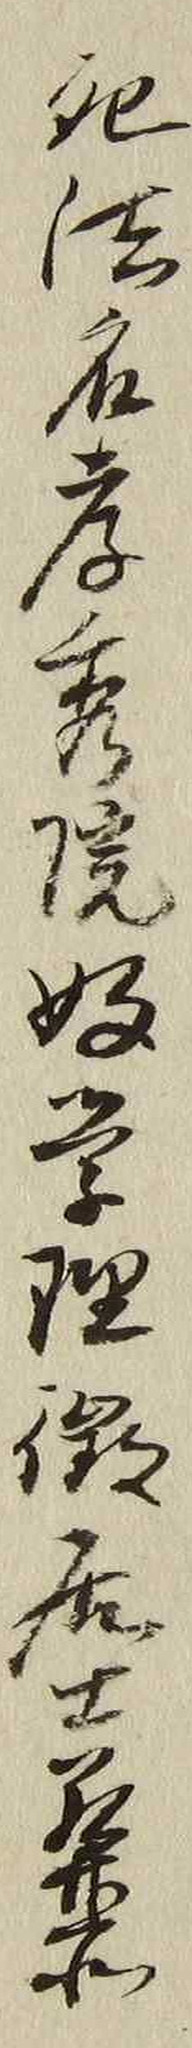死法名孝秀院好学理徴居士葬所
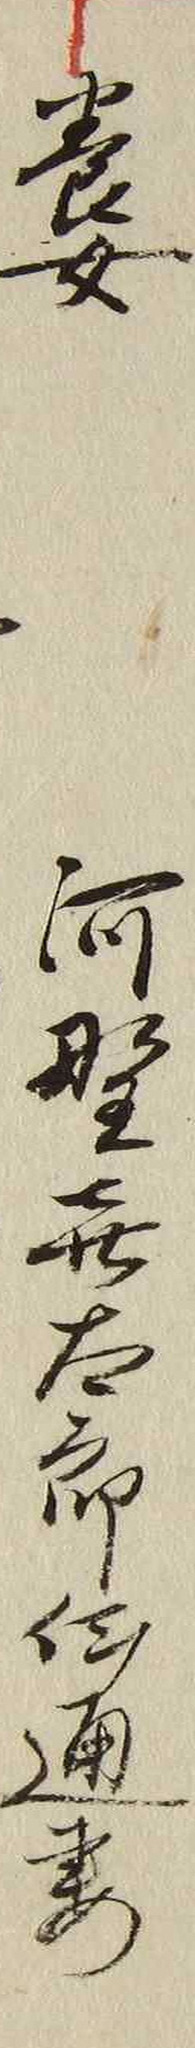養女河野喜太郎伊通妻
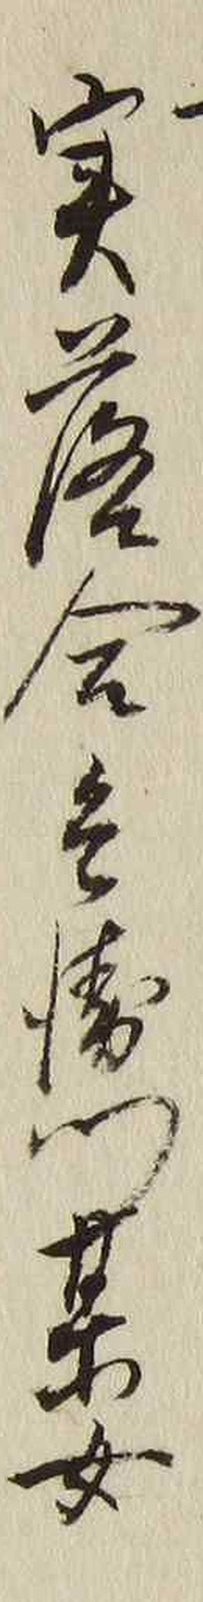実落合兵衛門某女
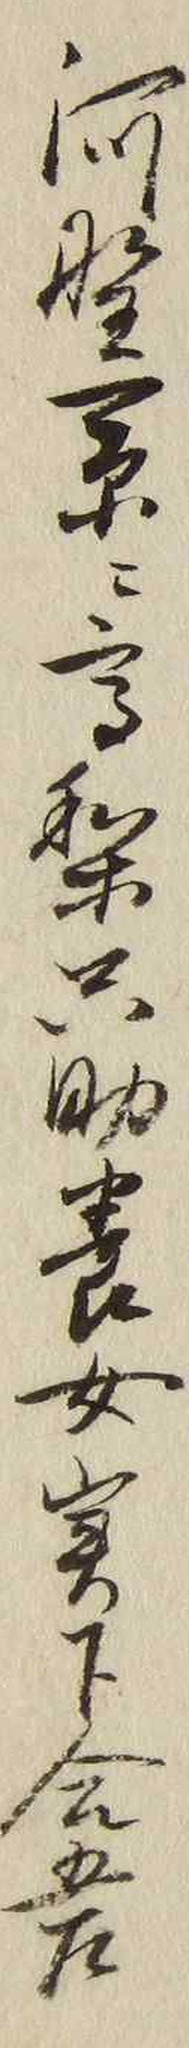河野系ニ高梨只助養女実下合五左

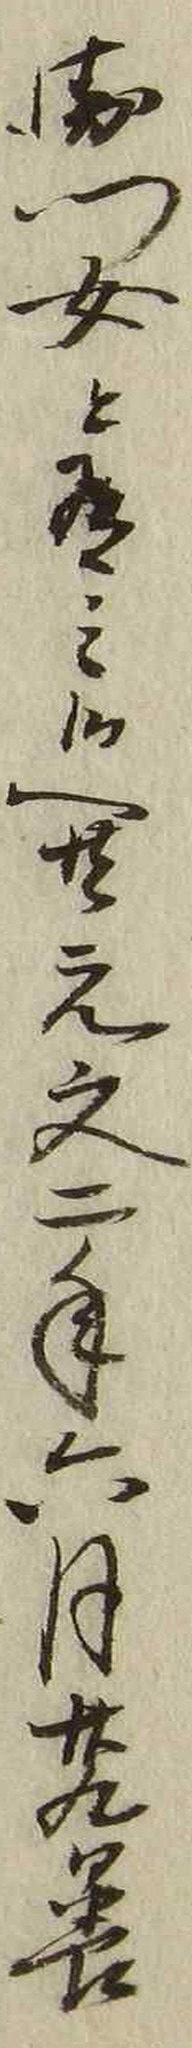衛門女と有之候へ共元文二年六月廿九日養
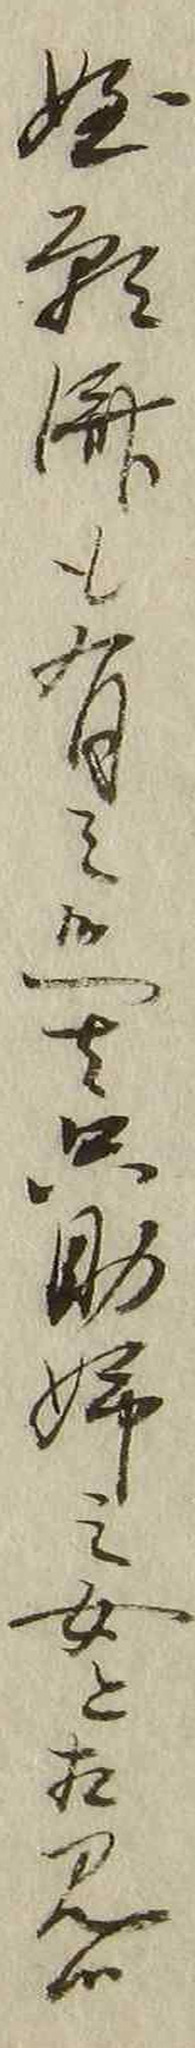姪願済と有之候へ者只助姉之女と相見候
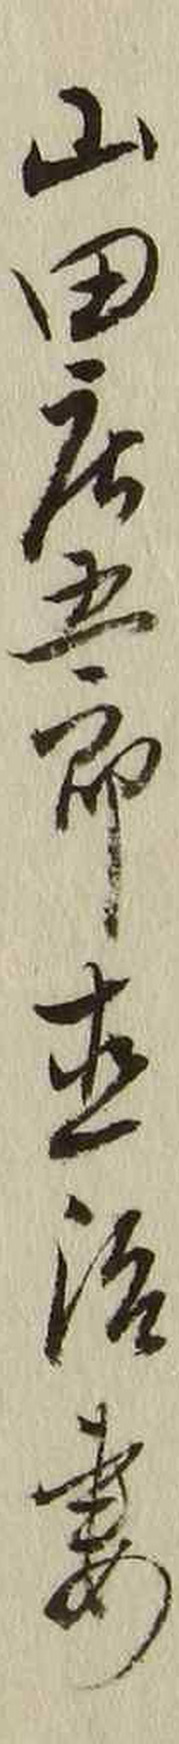女山田庄五郎直治妻
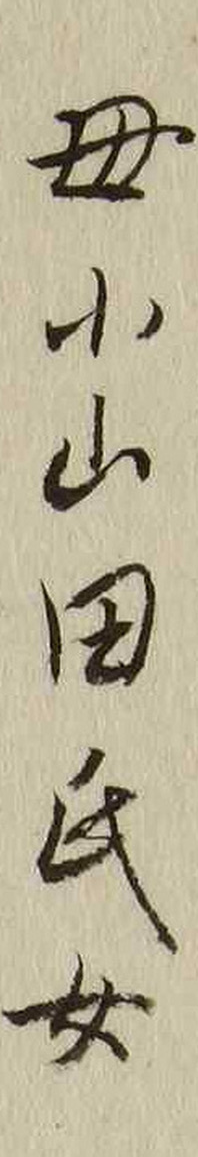母小山田氏女
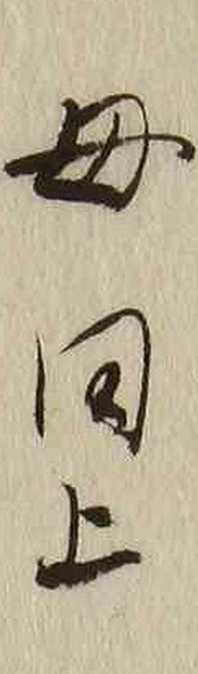母同上
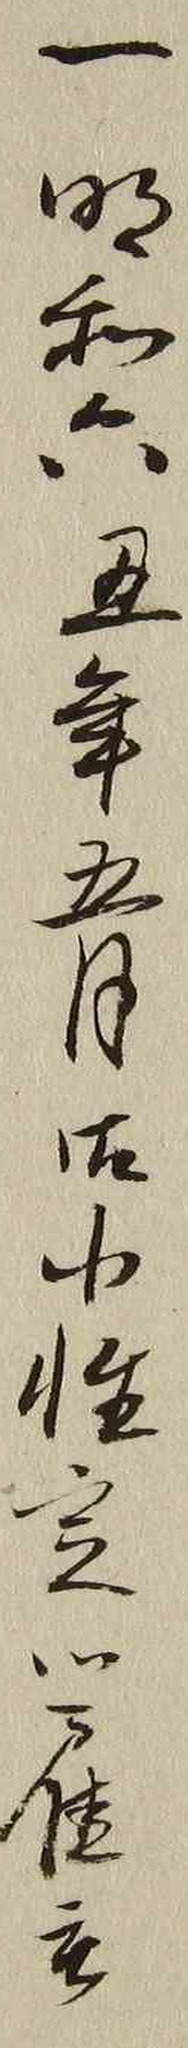一明和六丑年五月御小性定御雇被
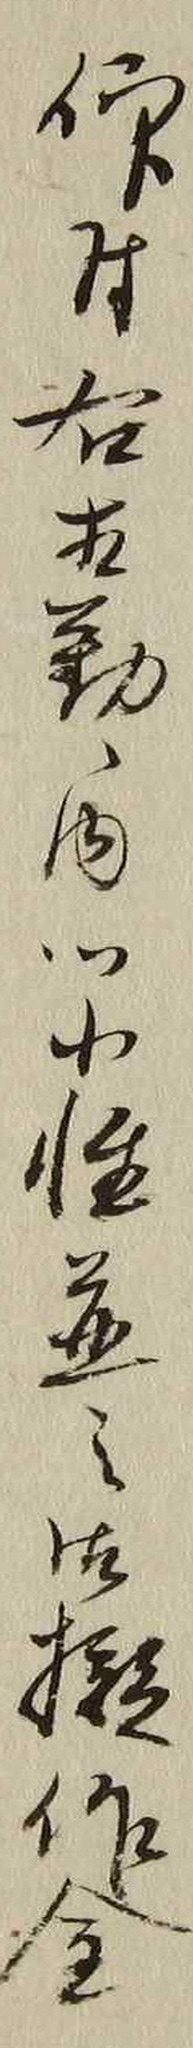仰付右相勤候内御小性並之御擬作金
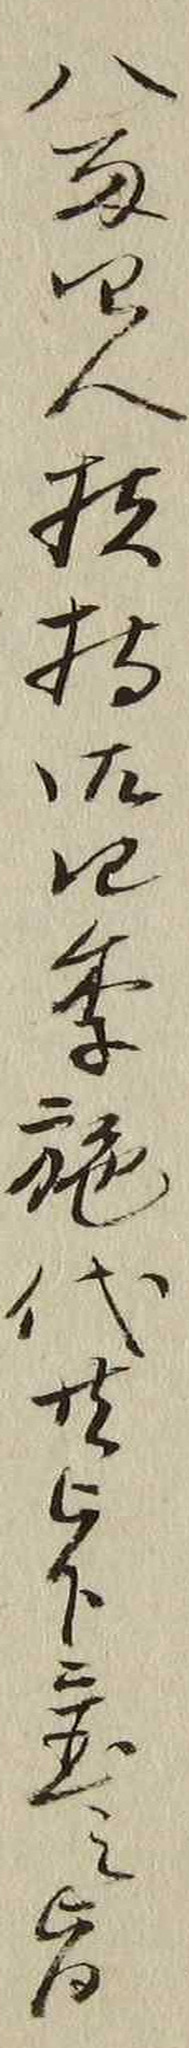八両四人扶持御四季施代共被下置之旨
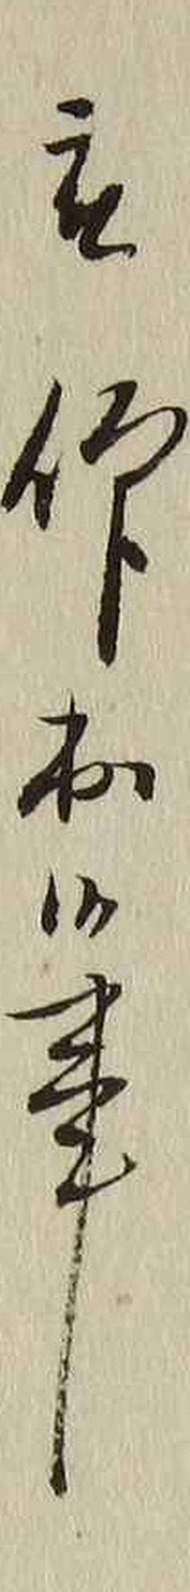被仰出候事
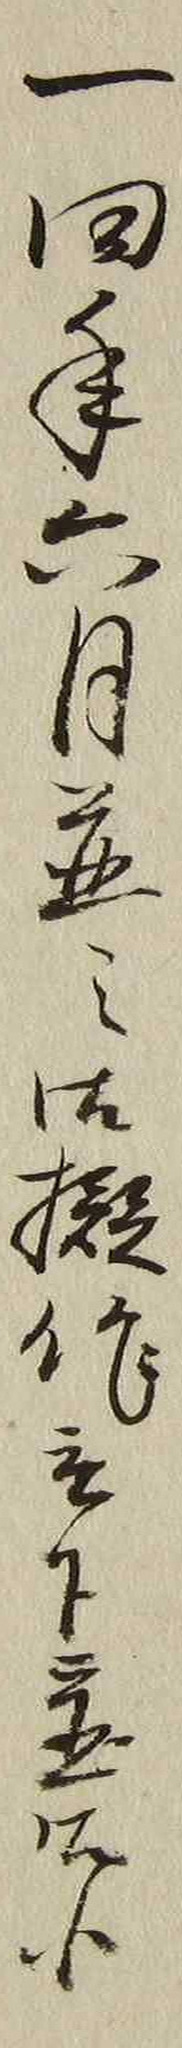一同年六月並之御擬作被下置御小
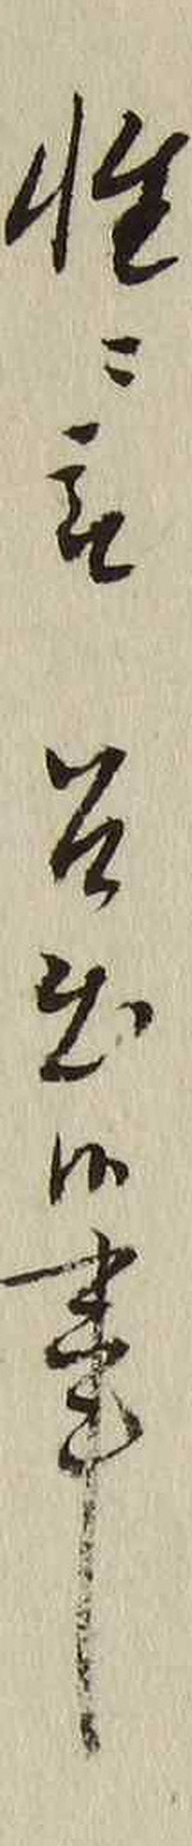性ニ被召出候事
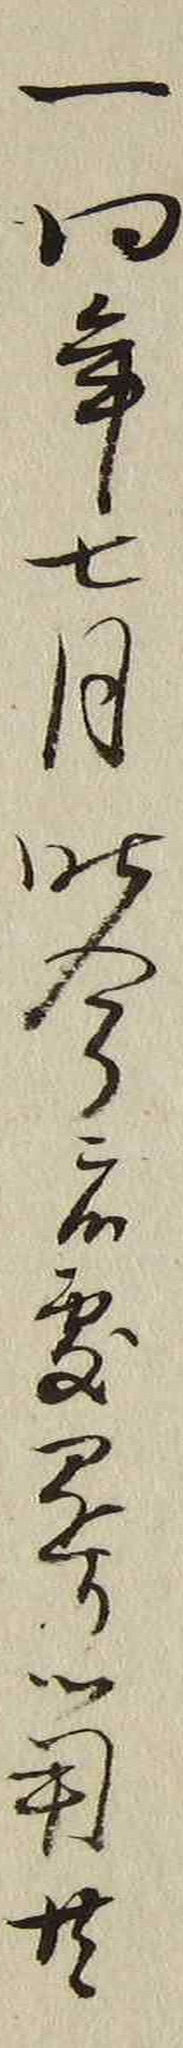一同年七月昨今ニ候処懸り御用共
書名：諸士系譜　巻之359　す之部9
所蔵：会津若松市立会津図書館
